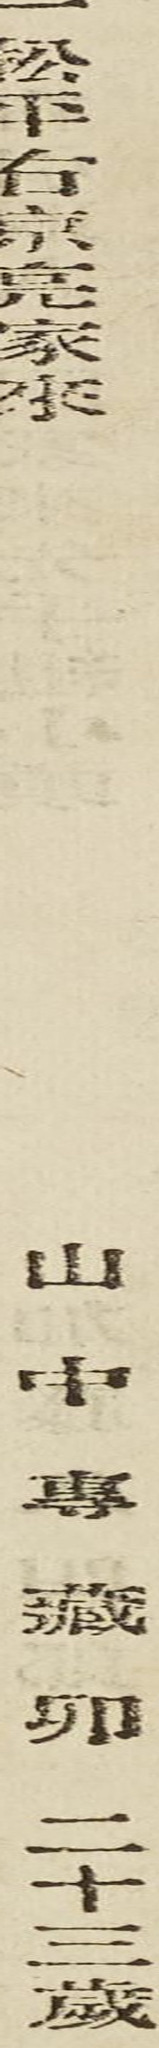一松平右京亮家来山中専蔵卯二十三歳
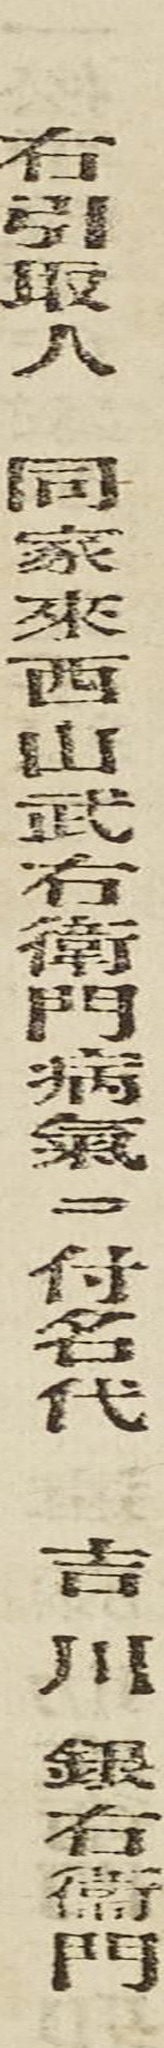右引取人同家来西山武右衛門病気ニ付名代吉川銀右衛門
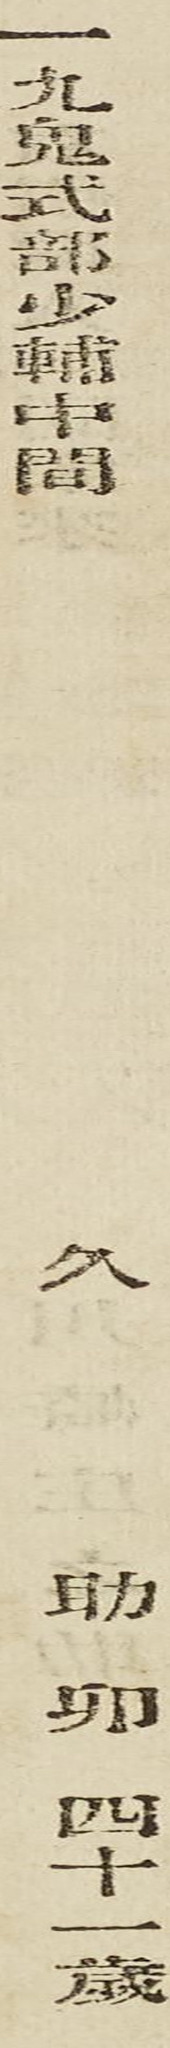一九鬼式部少輔中間久助卯四十一歳
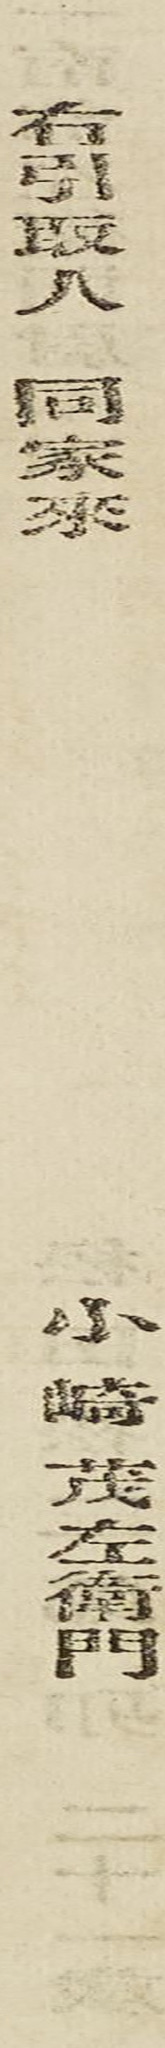右引取人同家来小崎茂左衛門
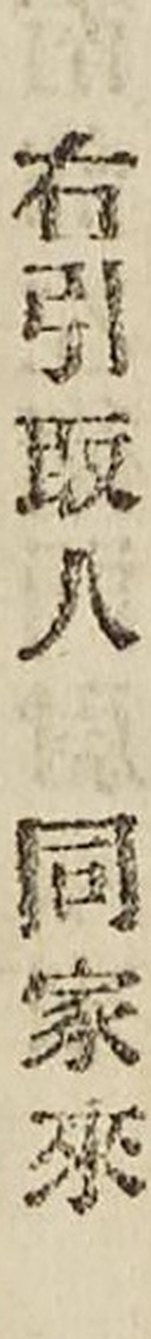右引取人同同
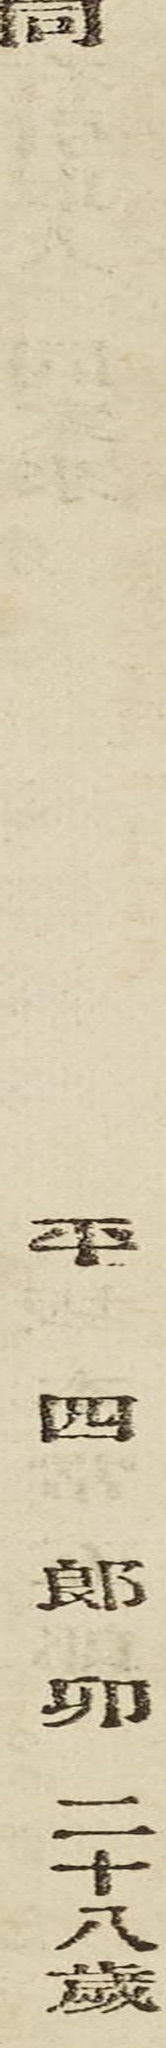一同平四郎卯二十八歳
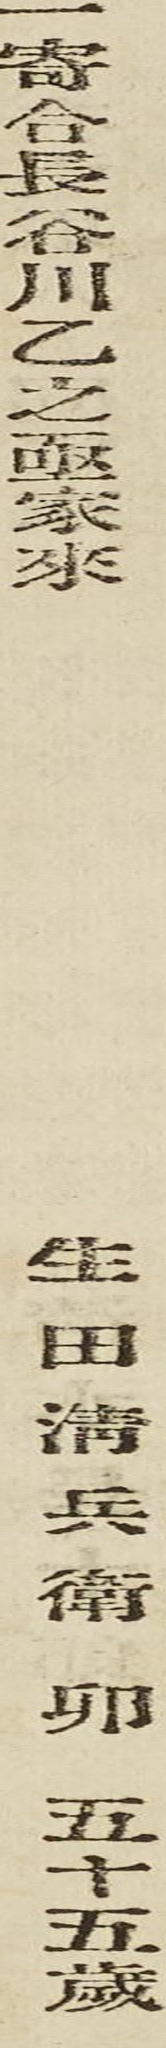一寄合長谷川乙之丞家来生田清兵衛卯五十五歳
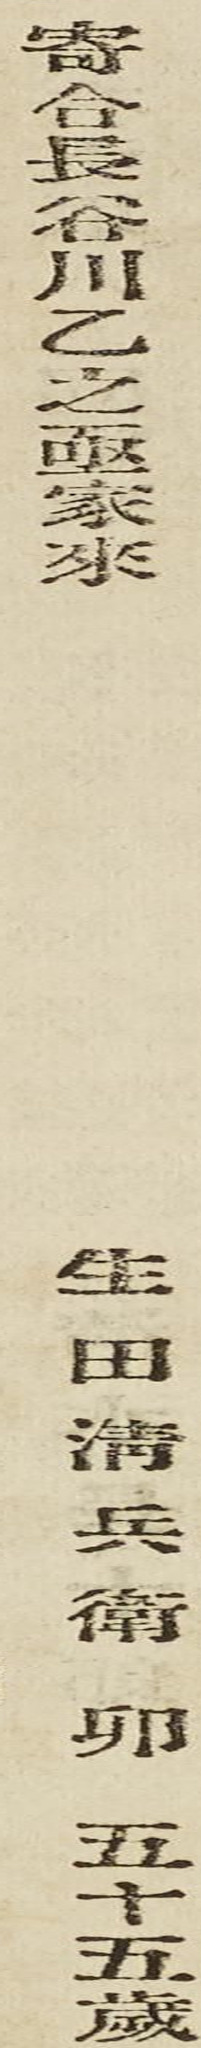一寄合長谷川乙之丞家来生田清兵衛卯五十五歳
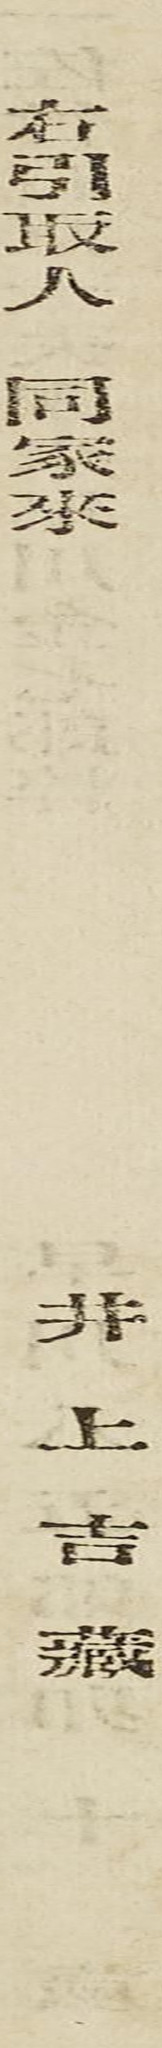右引取人同家来井上吉藏
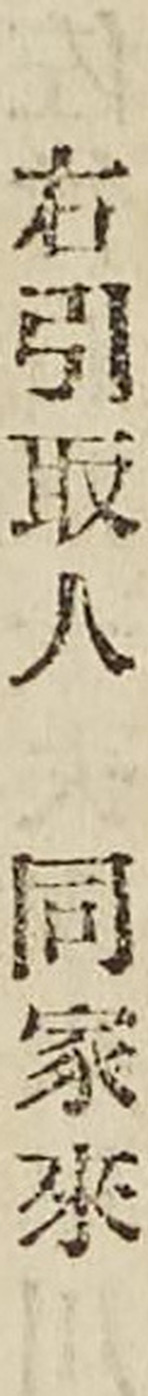右引取人同同
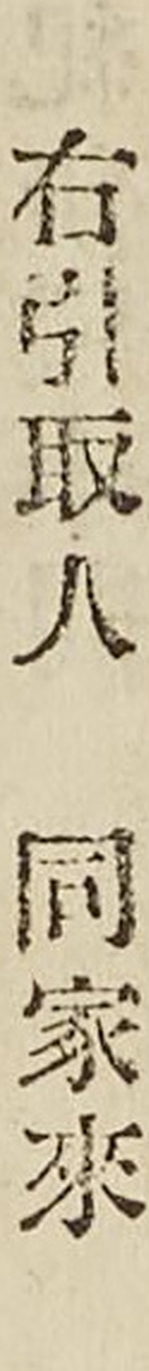右引取人同同
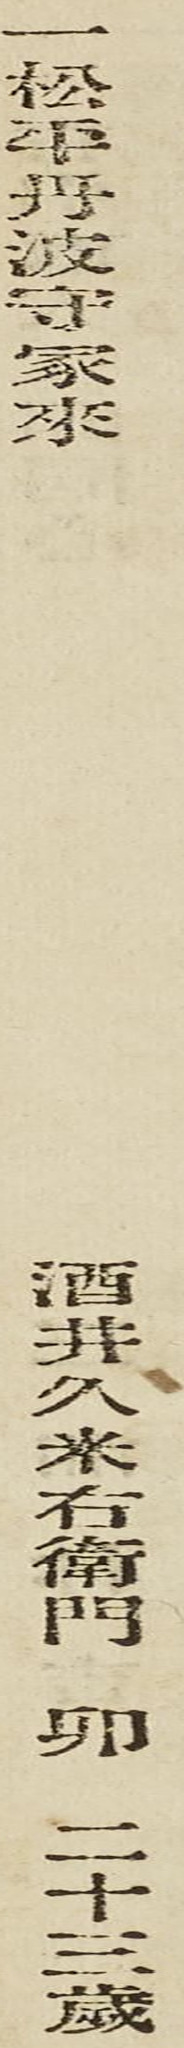一松平丹波守家来酒井久米右衛門卯二十三歳
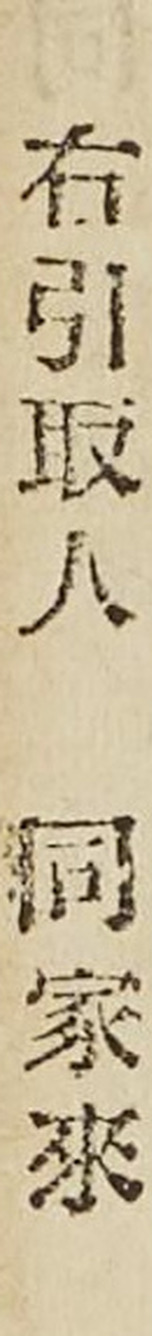右引取人同同
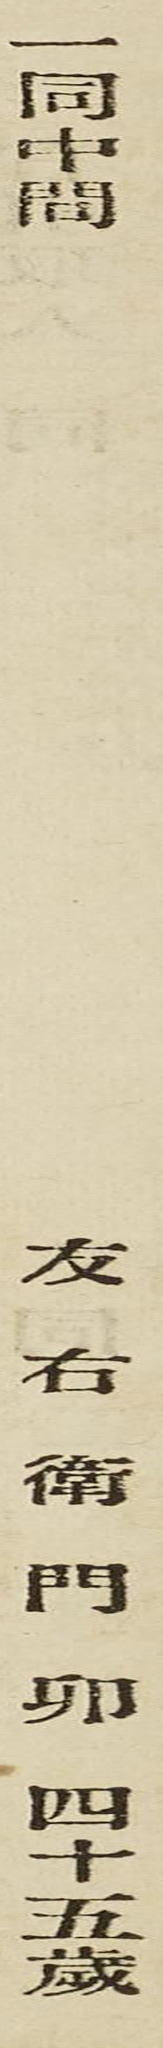一同中間友右衛門卯四十五歳
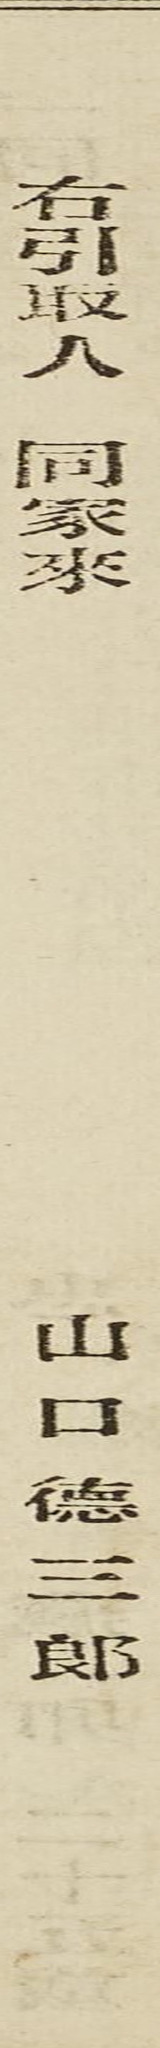右引取人同家来山口徳三郎
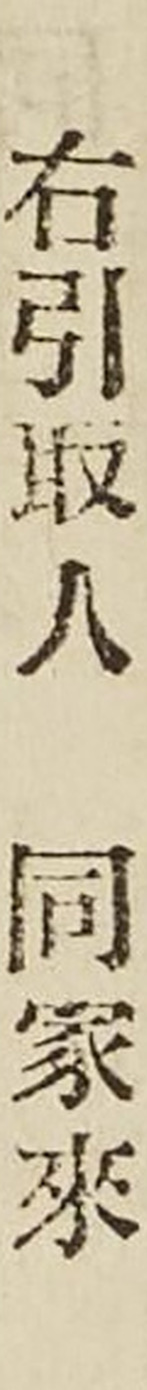右引取人同同
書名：永代惨話　文化の夢　全
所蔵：東京大学地震研究所図書室 Earthquake Research Institute Library, The University of Tokyo, JAPAN
